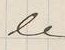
le
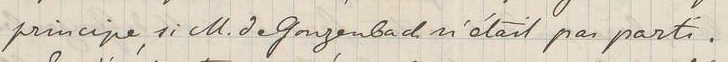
principe, si M. de Gonzenbach n'était pas parti.
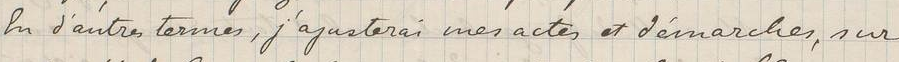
En d'autres termes, j'ajusterai mes actes et démarches, sur
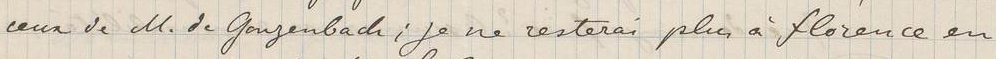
ceux de M. de Gonzenbach; je ne resterai plus à Florence en
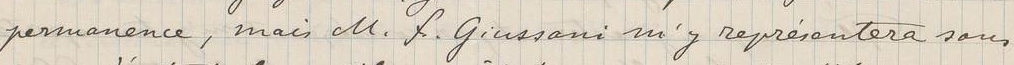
permanence, mais M. F. Giussani m'y représentera sans
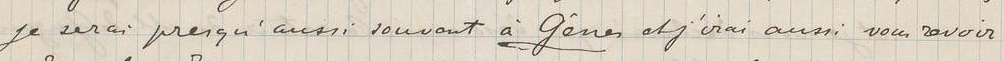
je serai presqu'aussi souvent à Gênes et j'irai aussi vous revoir
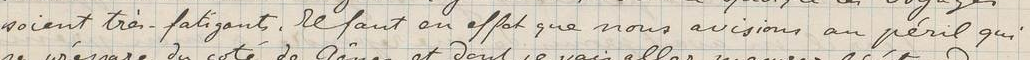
voient très-fatigants. Il faut en effet que nous avisions au péril qui
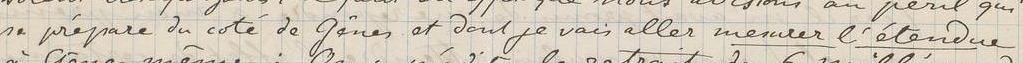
se prépare du coté de Gênes et dont je vais aller mesurer l'étendue
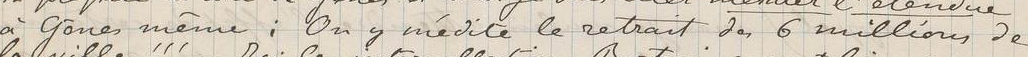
à Gênes même: On y médite le retrait des 6 millions de
